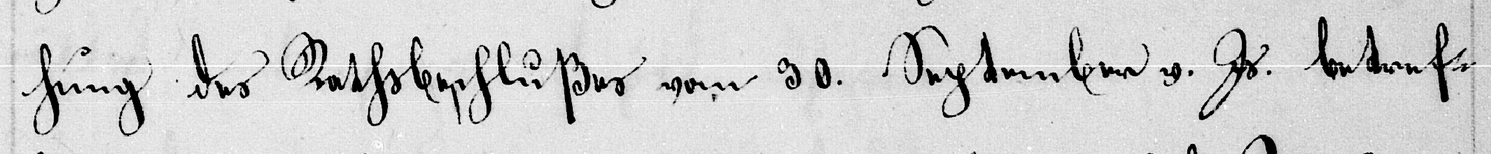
hung des Rathsbeschlußes vom 30. September v. Js. betref¬
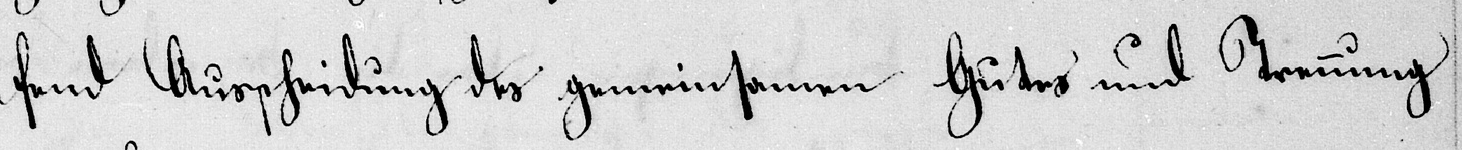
fend Ausscheidung des gemeinsamen Gutes und Trennung
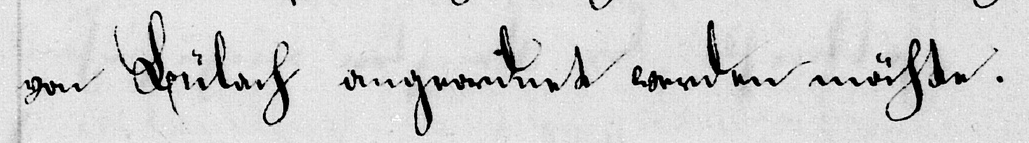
von Bülach angeordnet werden möchte.
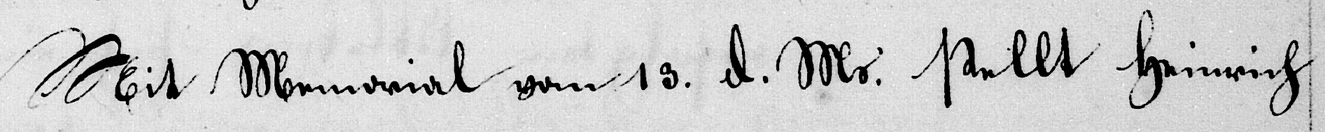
Mit Memorial vom 13. d. Ms. stellt Heinrich
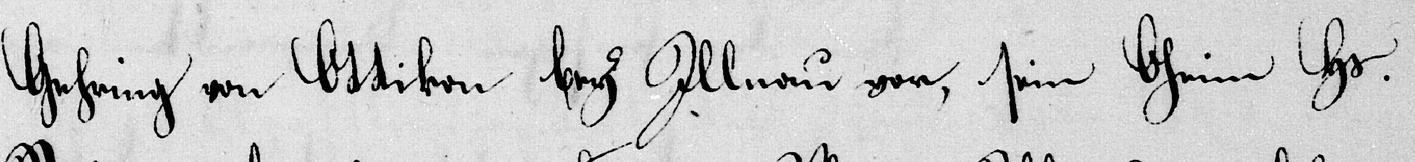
Gehring von Ottikon bey Illnau vor, sein Oheim Hs.
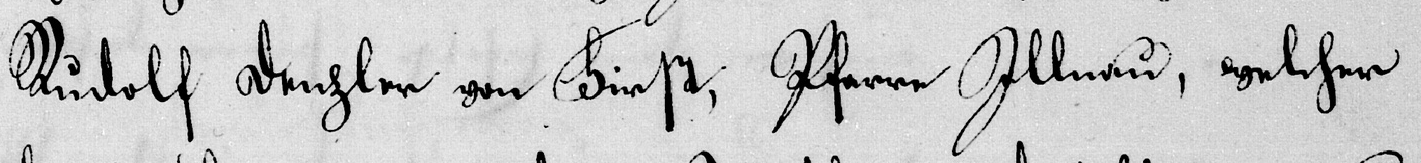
Rudolf Denzler von First, Pfarre Illnau, welcher
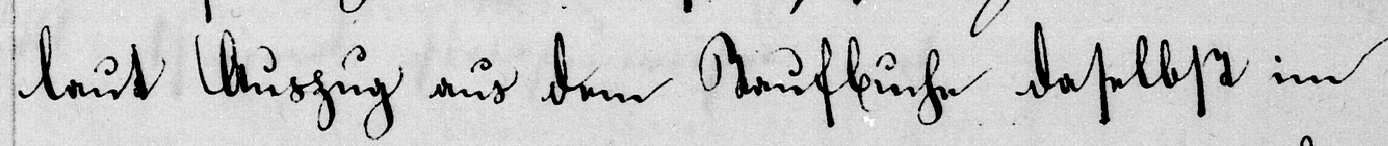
laut Auszug aus dem Taufbuche daselbst im
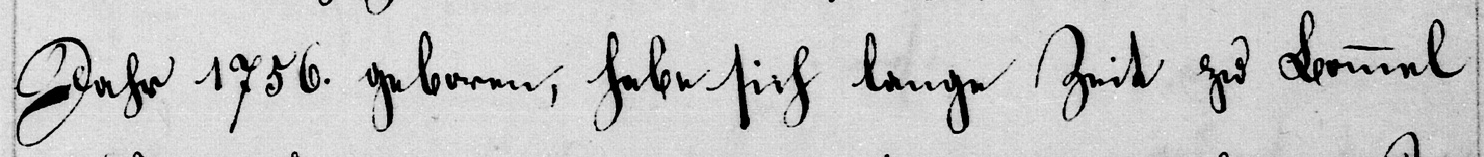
Jahr 1756. geboren, habe sich lange Zeit zu Bommel
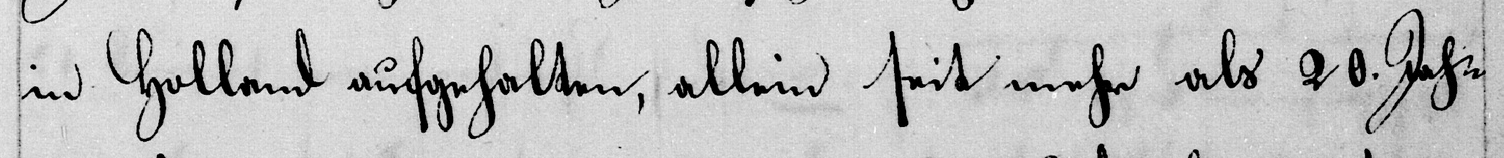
in Holland aufgehalten, allein seit mehr als 20. Jah¬
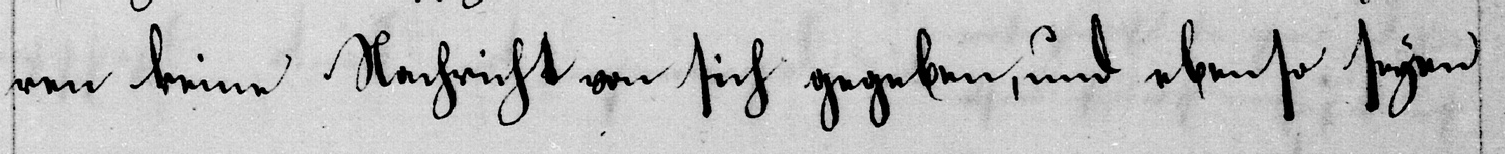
ren keine Nachricht von sich gegeben, und ebenso seyen
